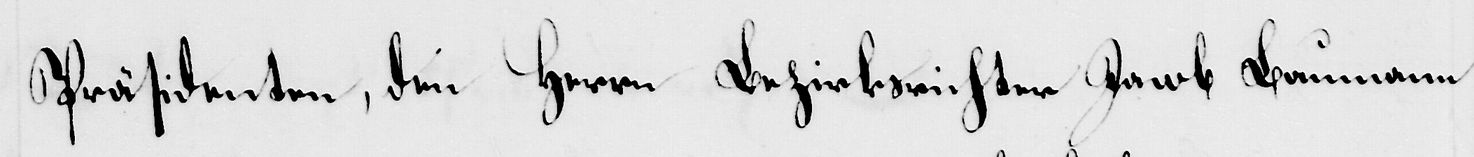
Präsidenten, den Herrn Bezirksrichter Jacob Baumann
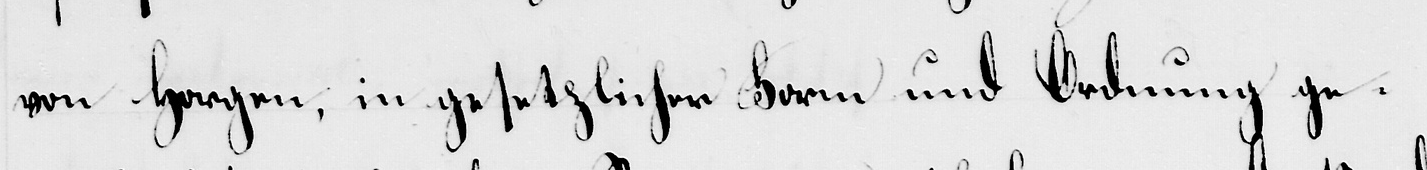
von Horgen, in gesetzlicher Form und Ordnung ge¬
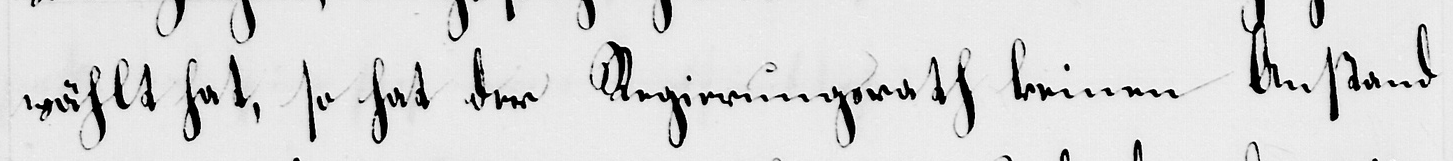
wählt hat, so hat der Regierungsrath keinen Anstand
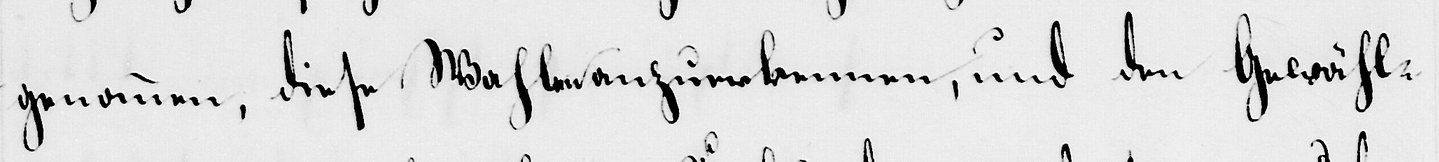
genommen, diese Wahlen anzuerkennen, und den Gewähl¬
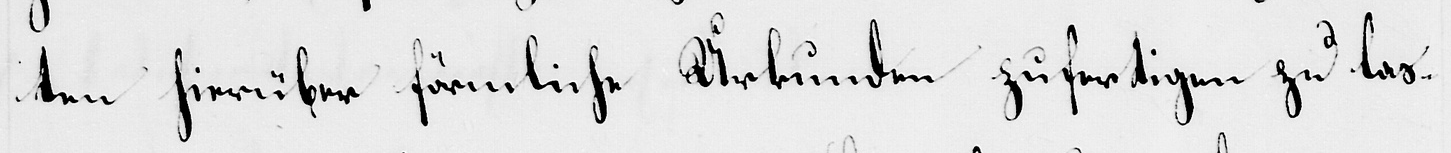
ten hierüber förmliche Urkunden zufertigen zu las¬
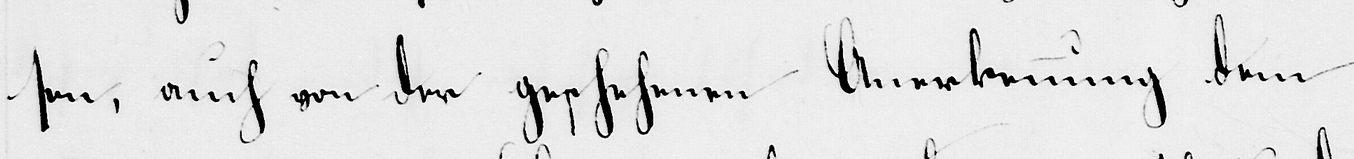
sen, auch von der geschehenen Anerkennung dem
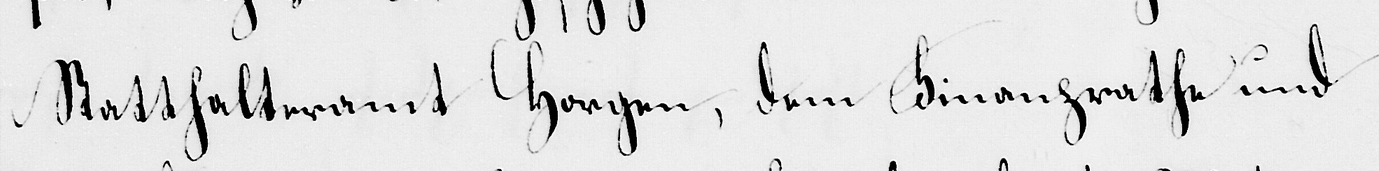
Statthalteramt Horgen, dem Finanzrathe und
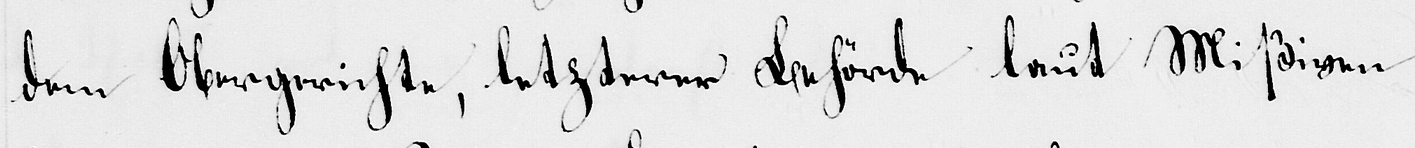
dem Obergerichte, letzterer Behörde laut Mißiven
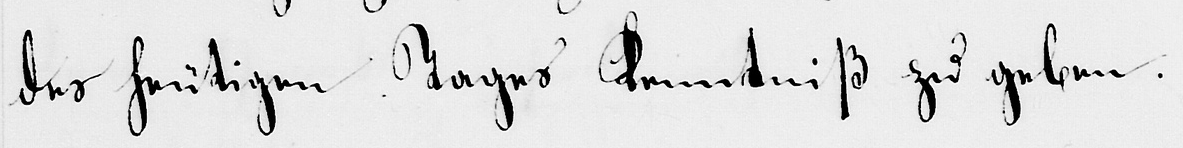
des heutigen Tages Kenntniß zu geben.
